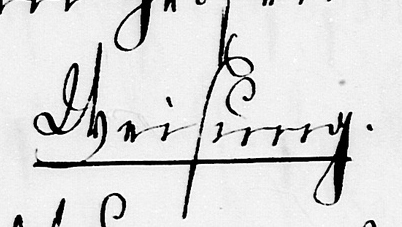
Weisung.
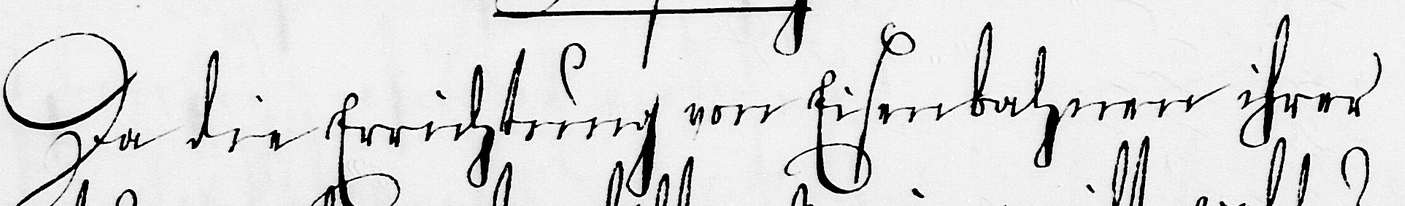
Da die Errichtung von Eisenbahnen ihrer
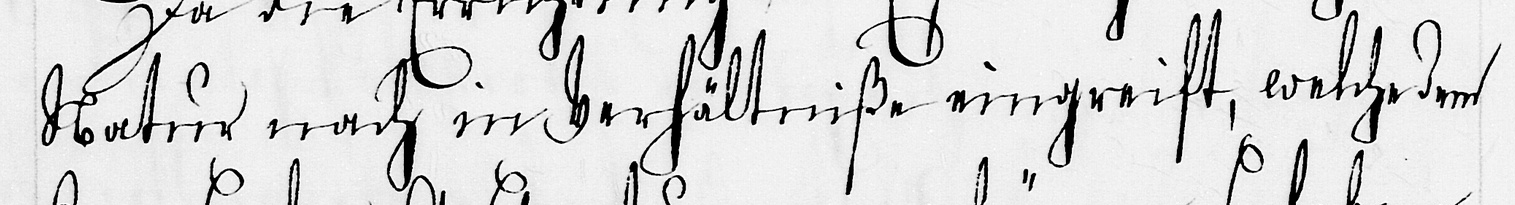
Natur nach in Verhältniße eingreift, welche dem
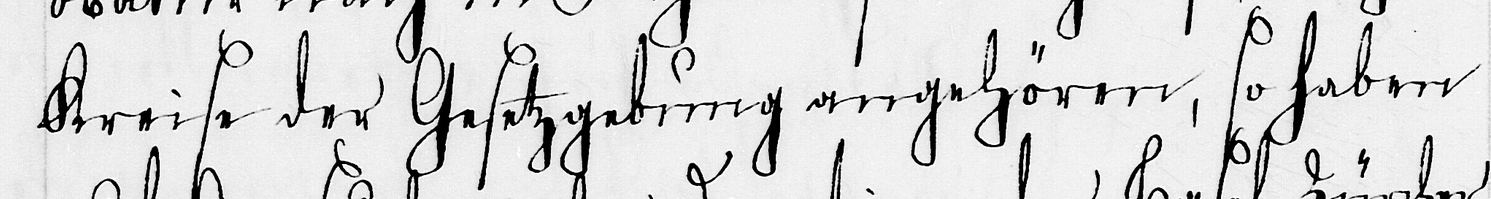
Kreise der Gesetzgebung angehören, so haben
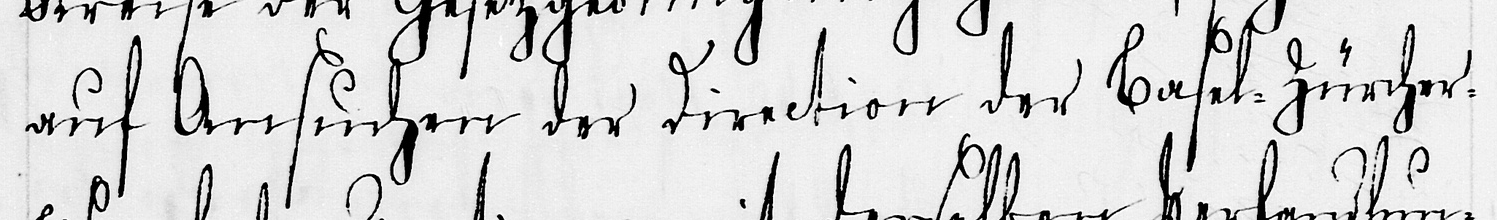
auf Ansuchen der Direction der Basel-Zürche¬
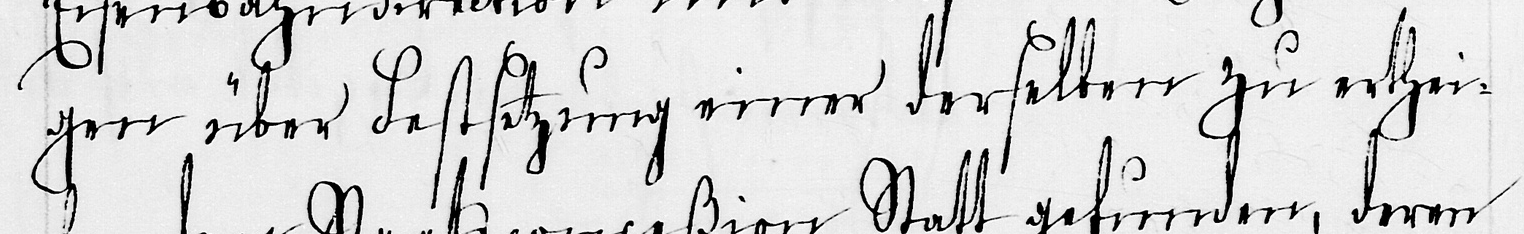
gen über Festsetzung einer derselben zu erthei¬
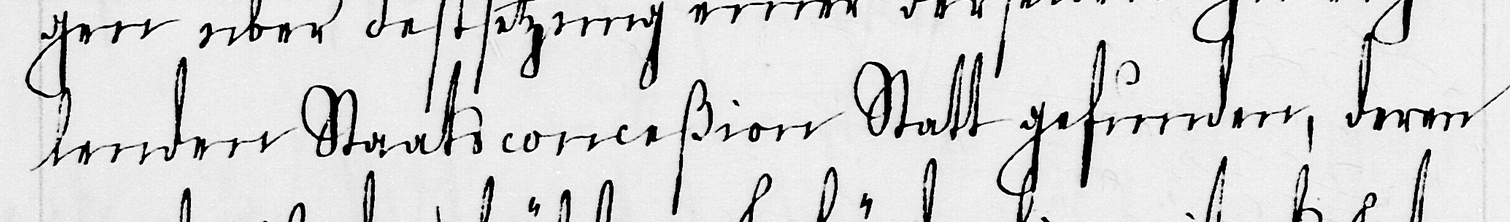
lenden Staatsconceßion Statt gefunden, deren
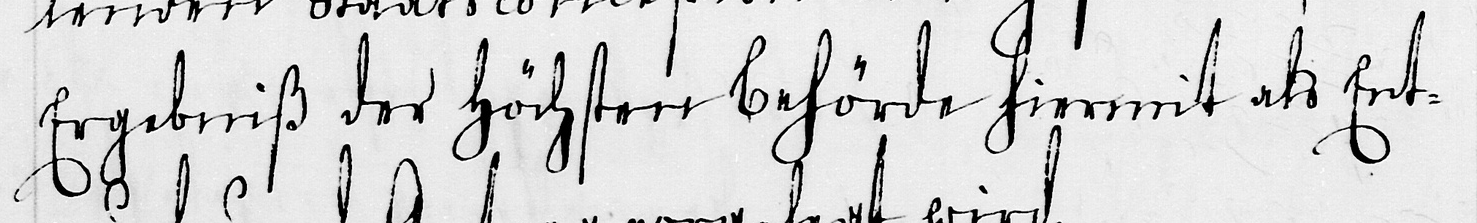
Ergebniß der Höchsten Behörde hiermit als Ent¬
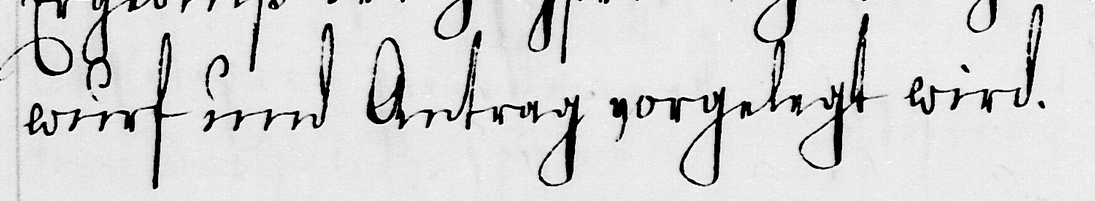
wurf und Antrag vorgelegt wird.
